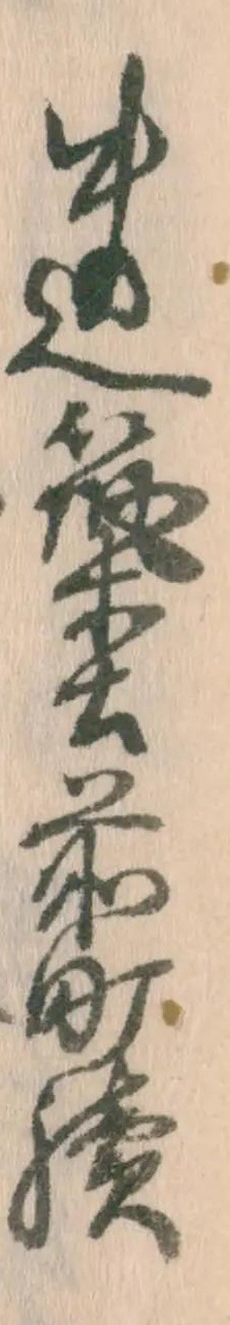牛込築土前町続
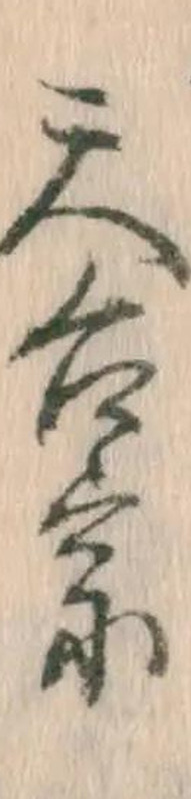天台宗
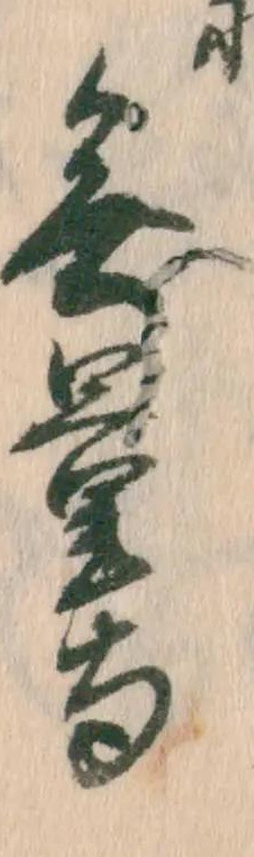無量寺
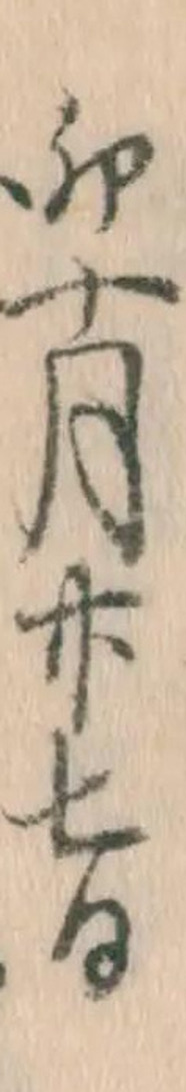卯十月廿七日
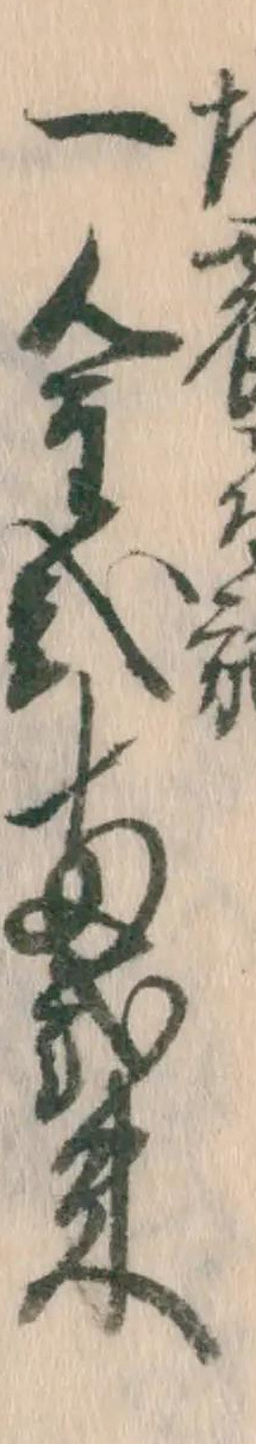一金弐両弐朱拾七人
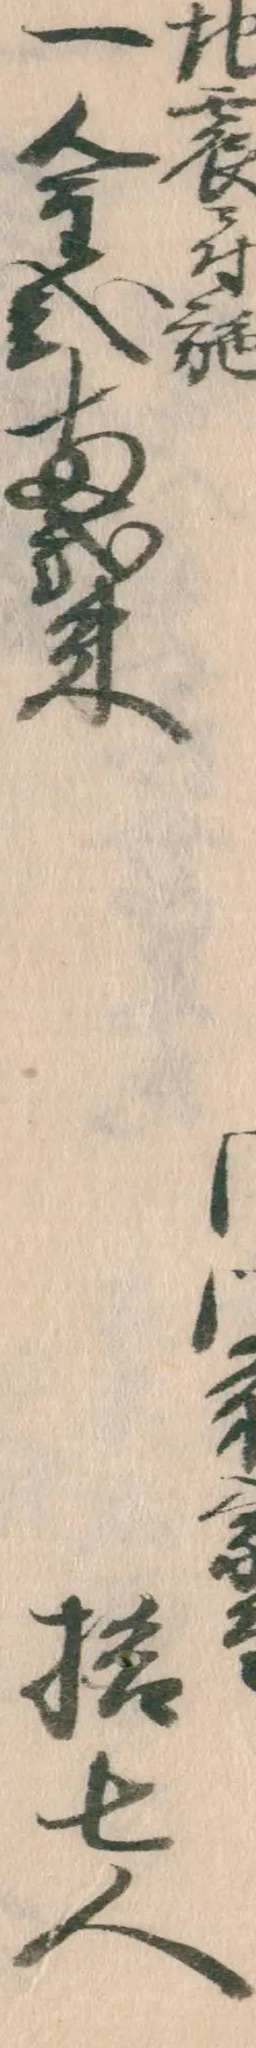一金弐両弐朱拾七人
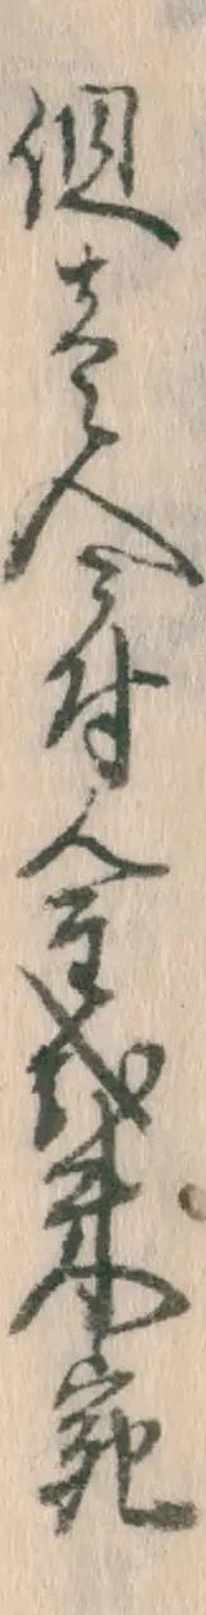但壱人ニ付金弐朱宛

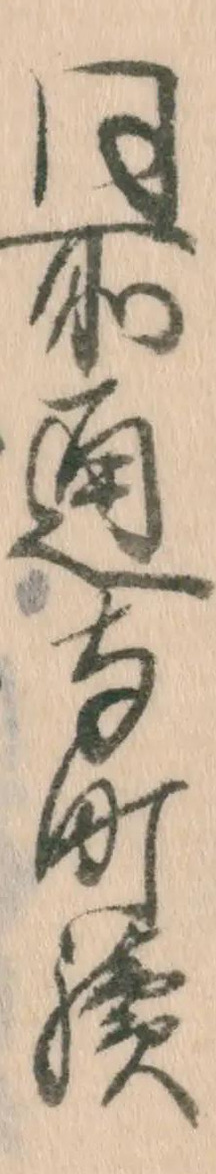同所通寺町続
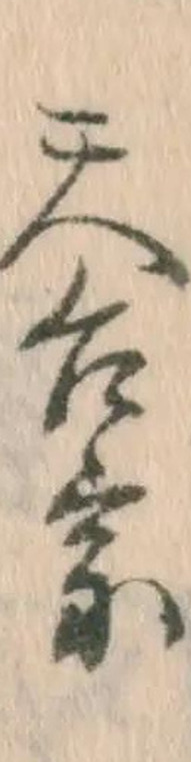天台宗
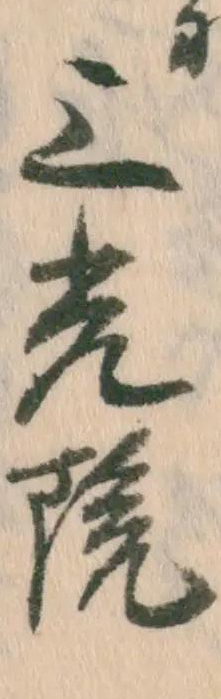三光院
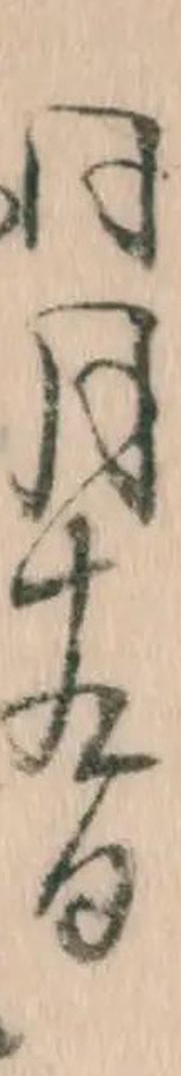同月十九日
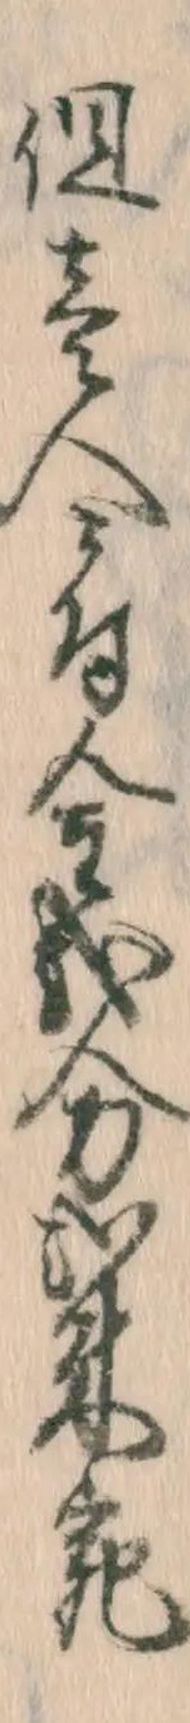但壱人ニ付金弐分弐朱宛
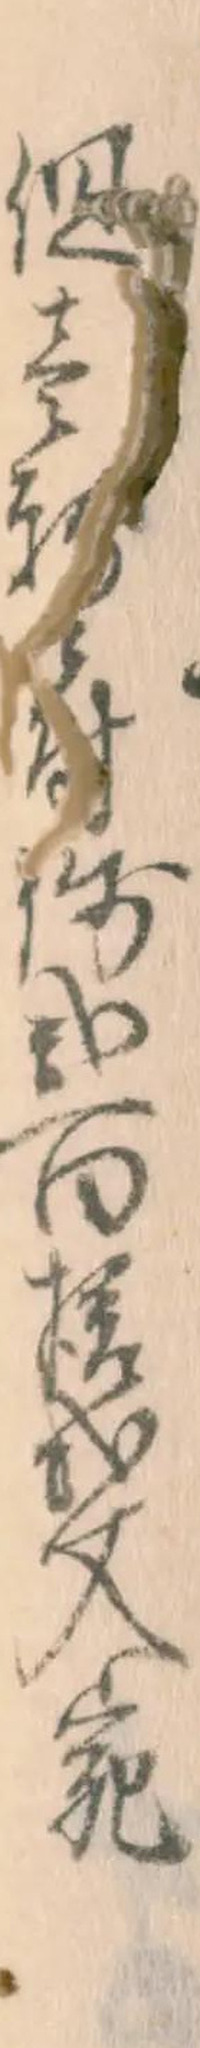但壱軒ニ付銭弐百拾弐文宛拾六軒
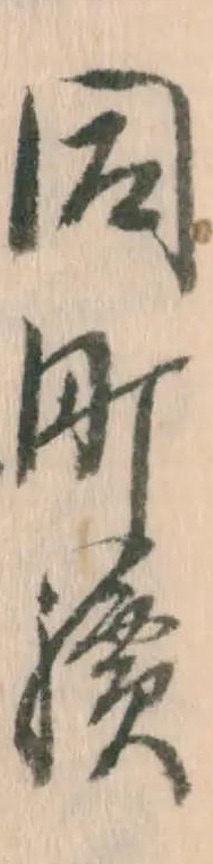同町続
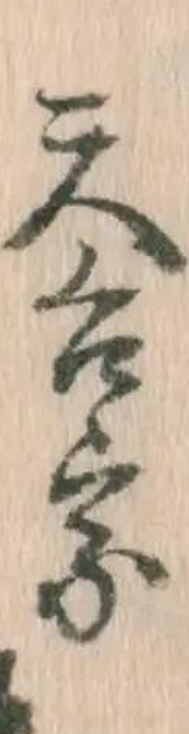天台宗
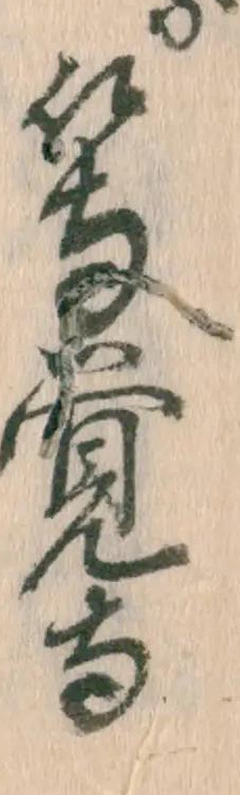等覚寺
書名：武家方并寺院等ニテ施差出候一件
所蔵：国立国会図書館 National Diet Library, JAPAN
